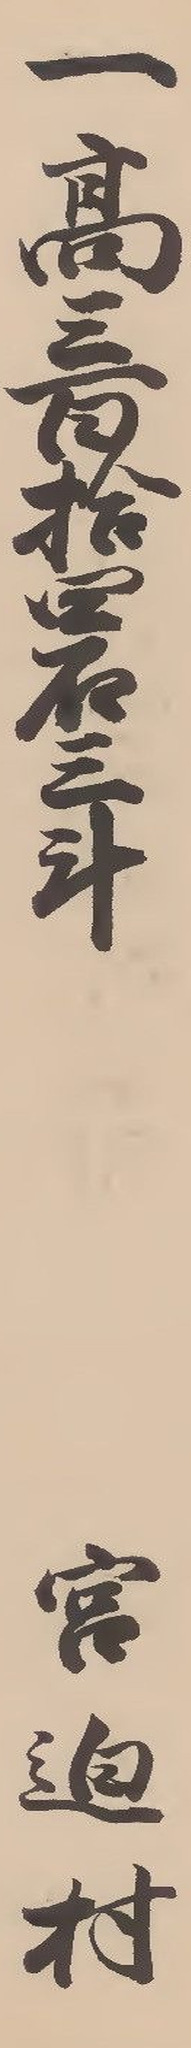一高三百拾四石三斗宮迫村
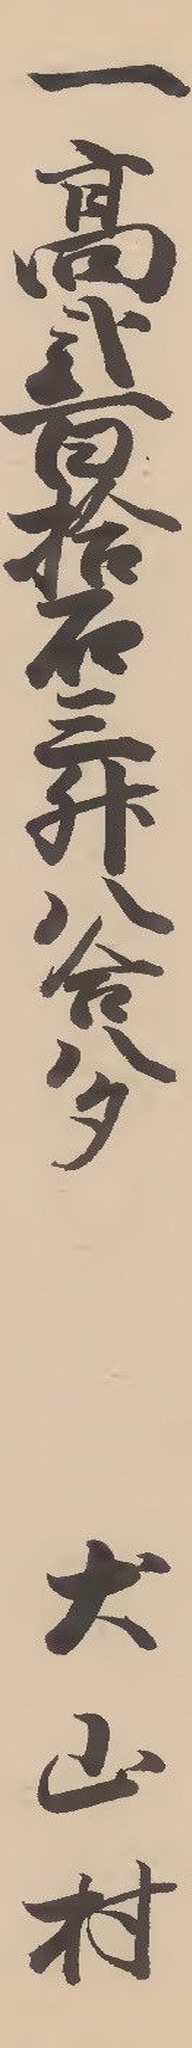一高弐百拾石三升八合八勺大山村
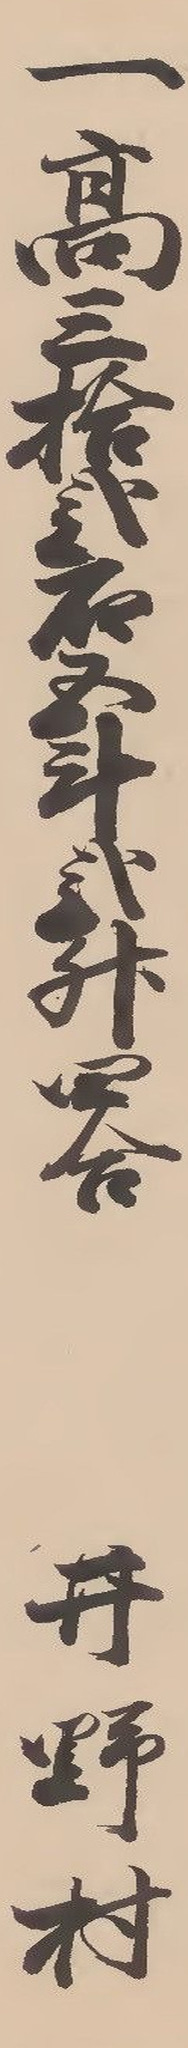一高三拾弐石五斗弐升四合井野村
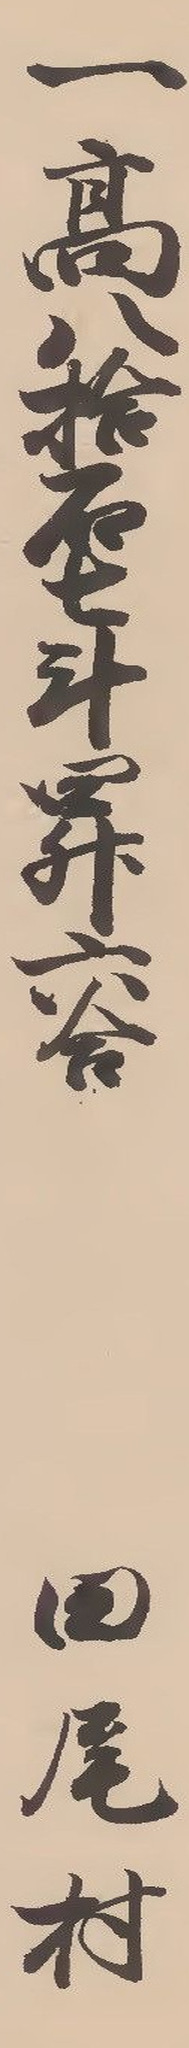一高八拾石七斗四升六合田尾村
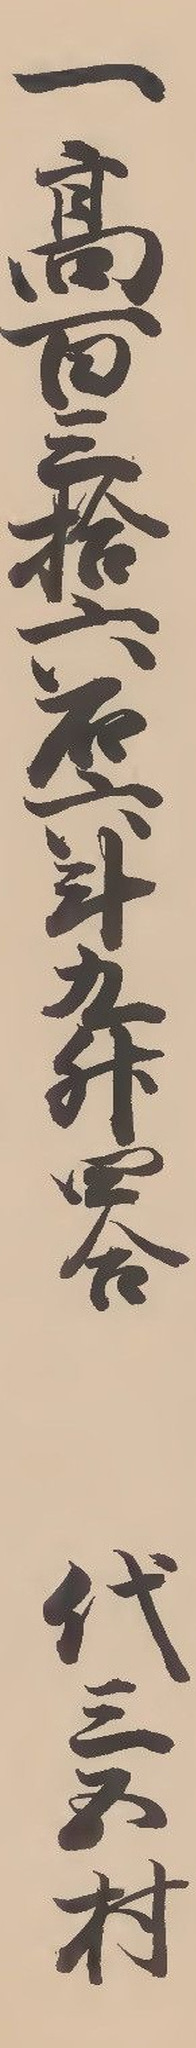一高百三拾六石六斗九升四合代三五村
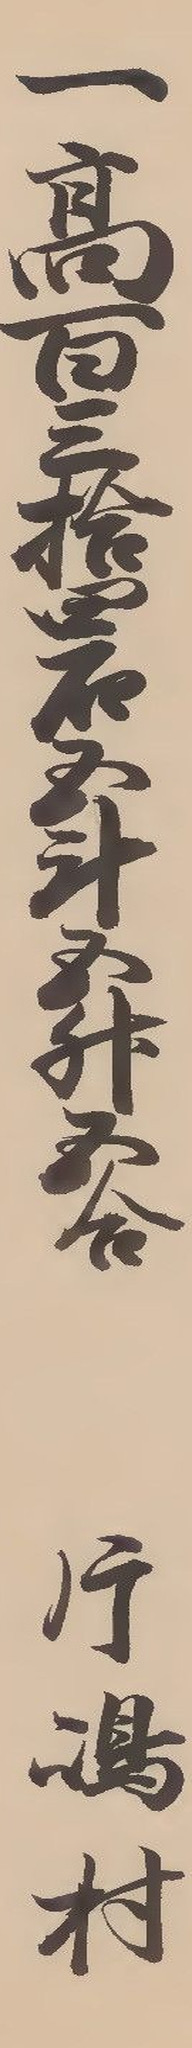一高百三拾四石五斗五升五合片島村
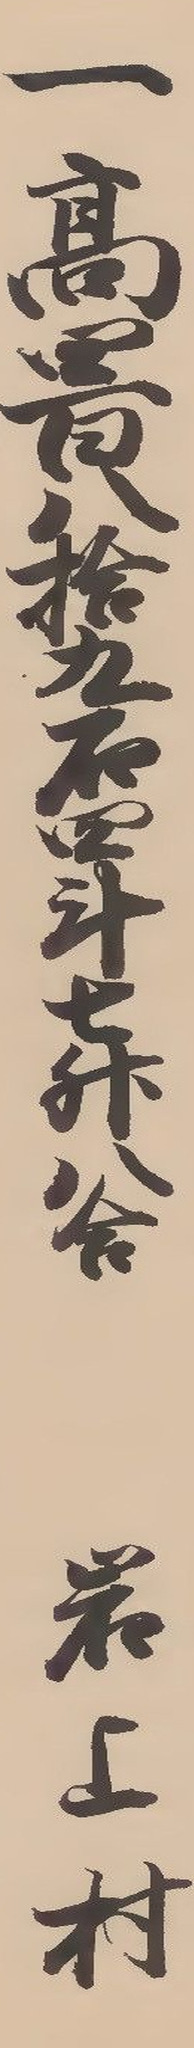一高四百八拾九石四斗七升八合岩上村
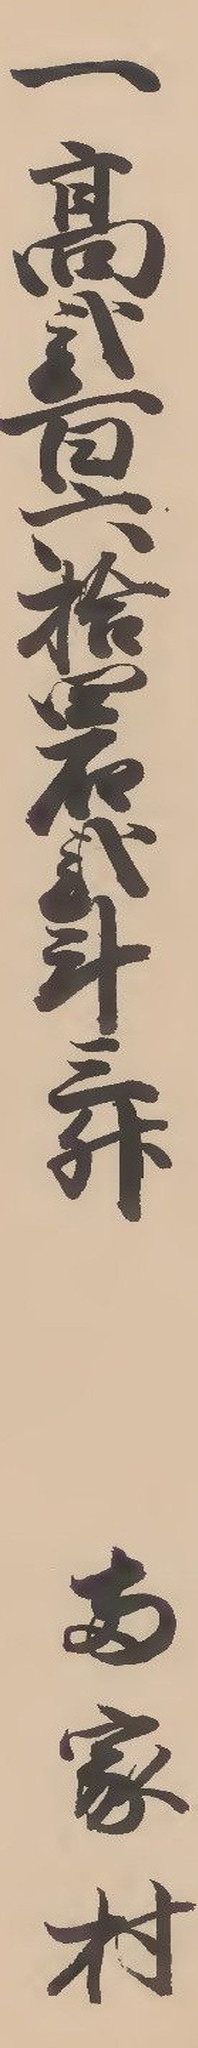一高弐百六拾四石弐斗三升両家村

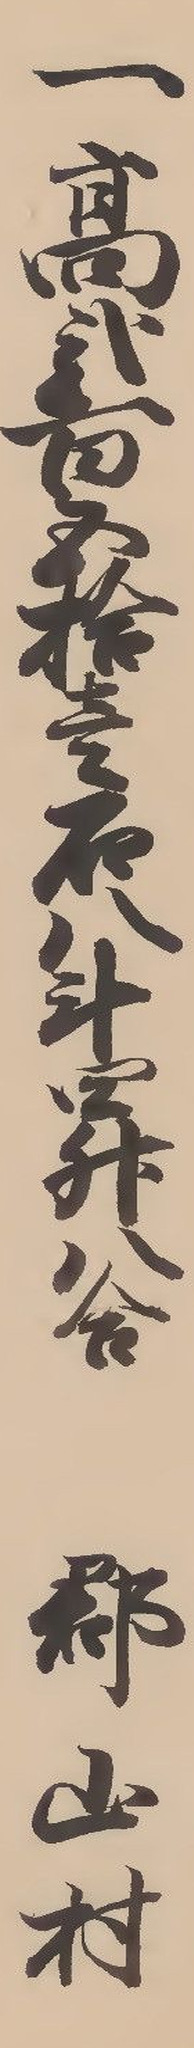一高弐百五拾壱石八斗四升八合郡山村
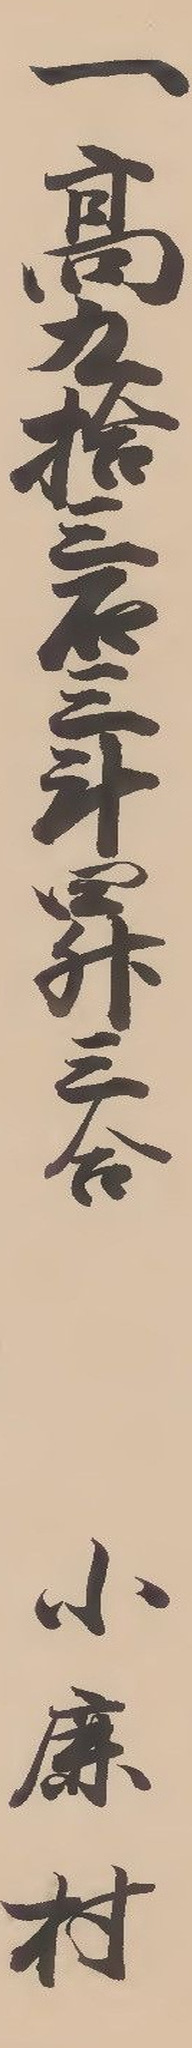一高九拾三石三斗四升三合小鹿村
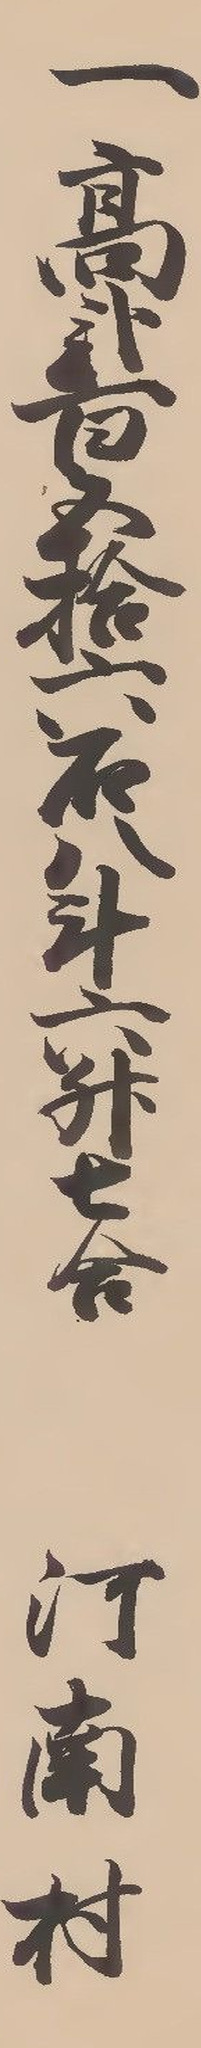一高弐百五拾六石八斗六升七合河南村
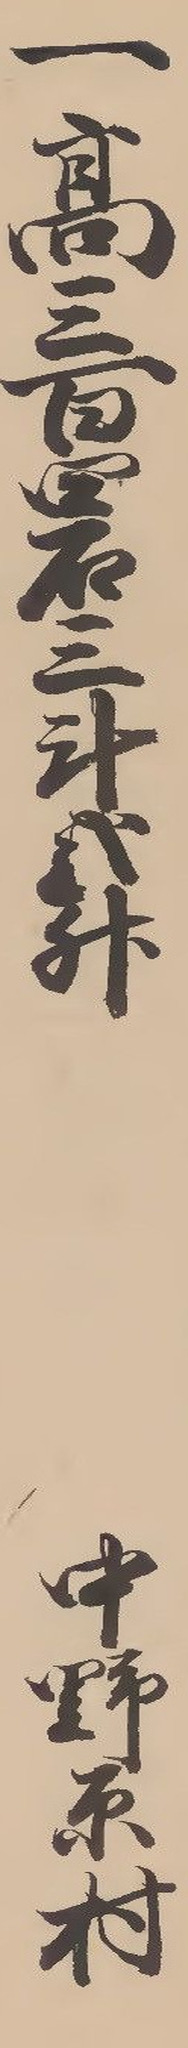一高三百四石三斗弐升中野原村
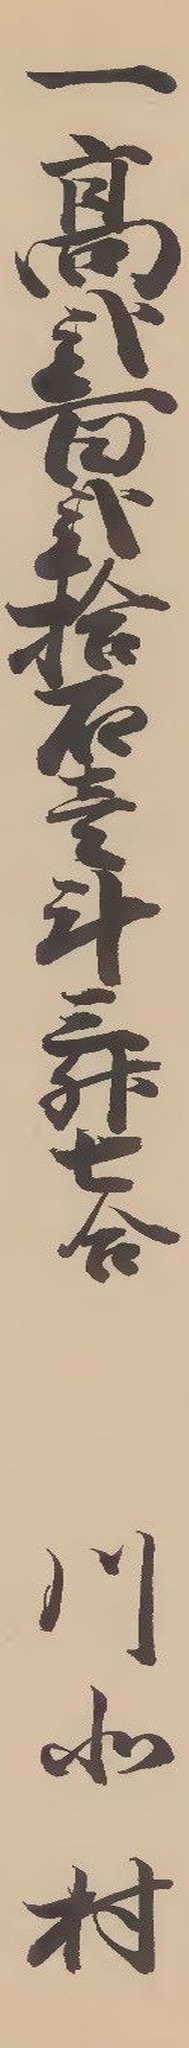一高弐百弐拾石壱斗三升七合川北村
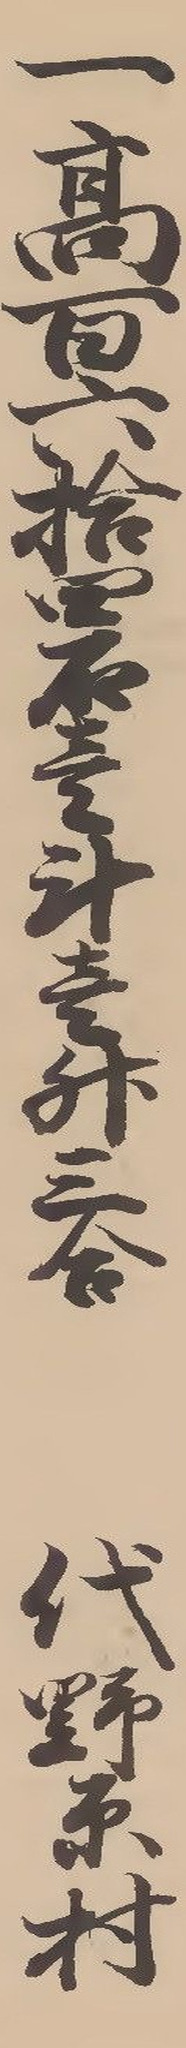一高百六拾四石壱斗壱升三合代野原村
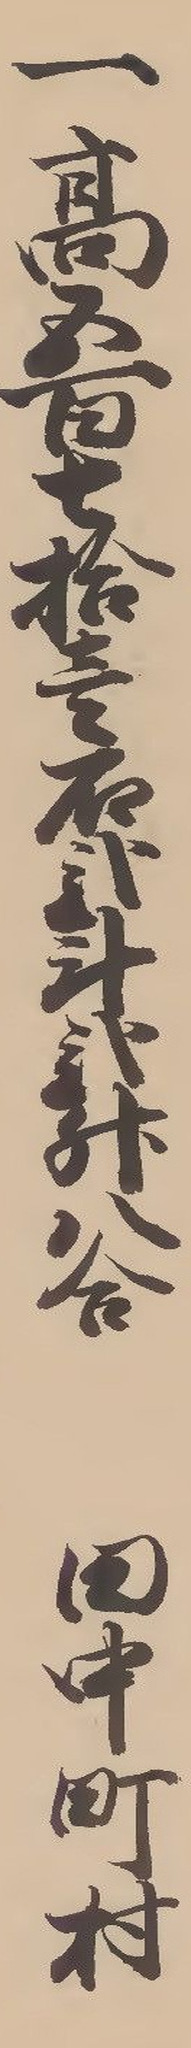一高五百七拾壱石弐斗弐升八合田中町村

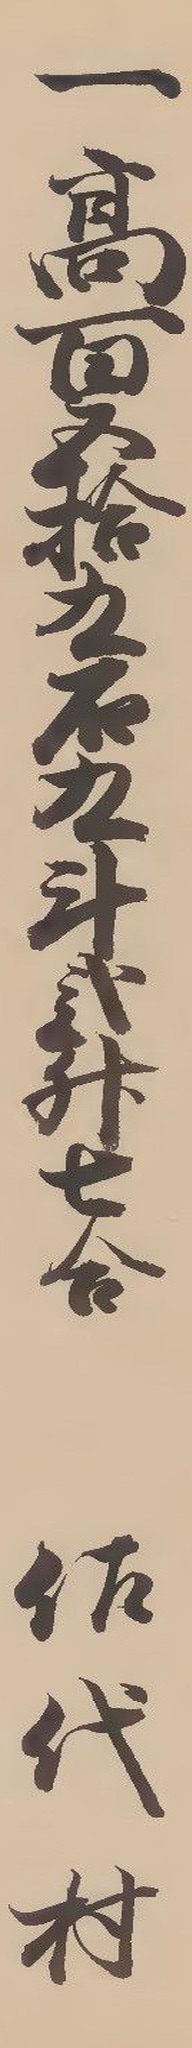一高百五拾九石九斗弐升七合佐代村
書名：豊後国郷帳
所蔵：国立公文書館 National Archives of Japan
